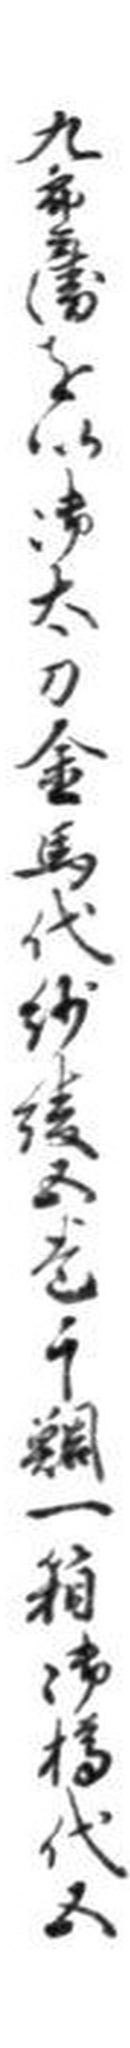九郎兵衛を以御太刀金馬代紗綾五巻干鯛一箱御樽代五
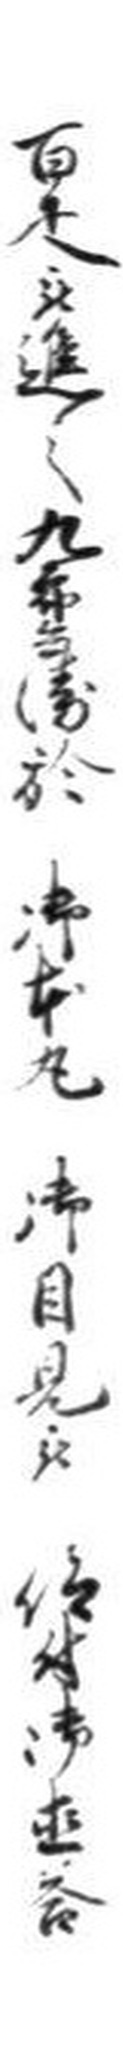百疋被進之九郎兵衛於御本丸御目見被仰付御直答
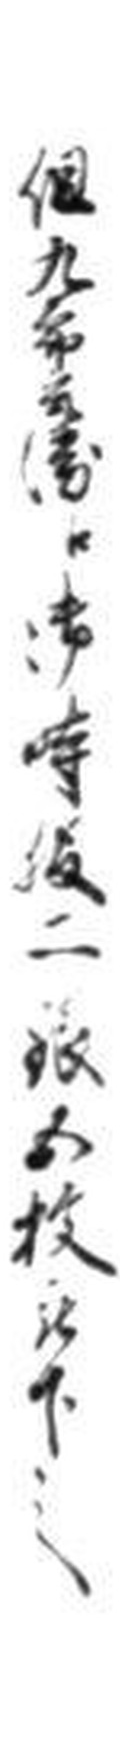但九郎兵衛江御時服二銀五枚被下之
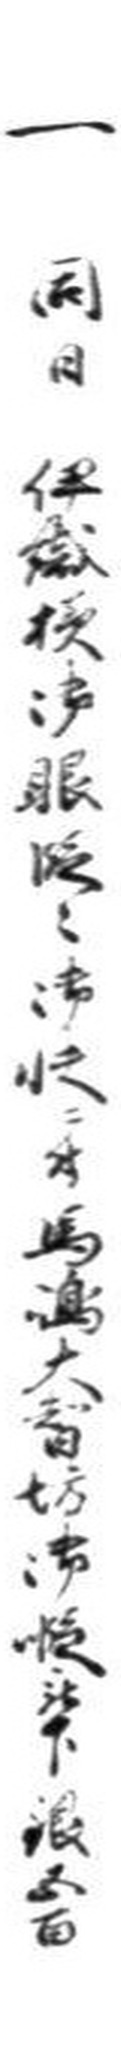一同日伊織様御眼段々御快ニ付馬嶋大智坊御暇被下銀五百
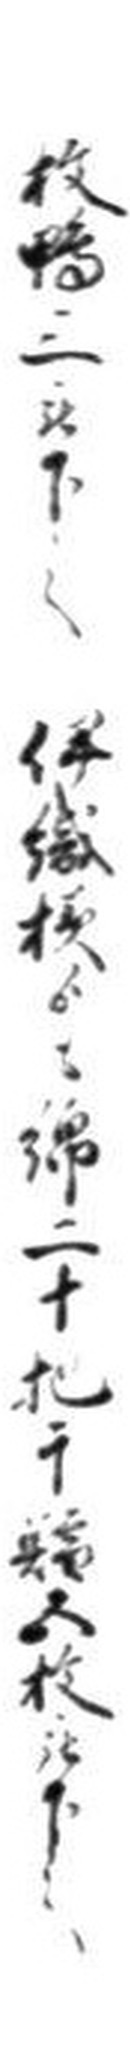枚鴨三被下之伊織様ゟも綿二十把干鱈五枚被下之
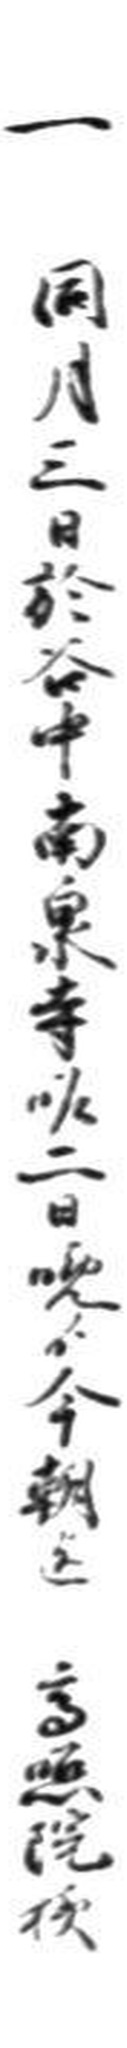一同月三日於谷中南泉寺昨二日晩ゟ今朝迄高照院様
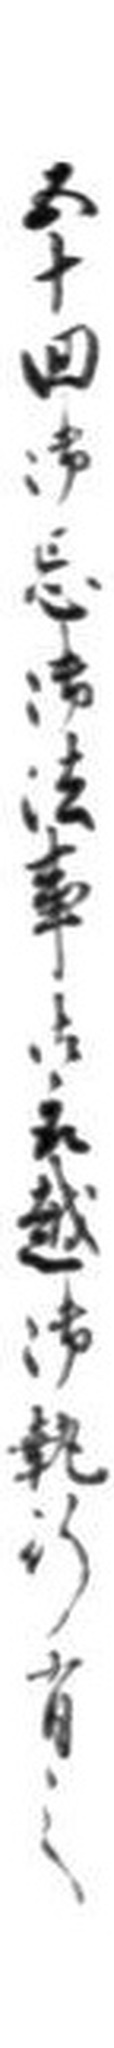五十回御忌御法事御取越御執行有之
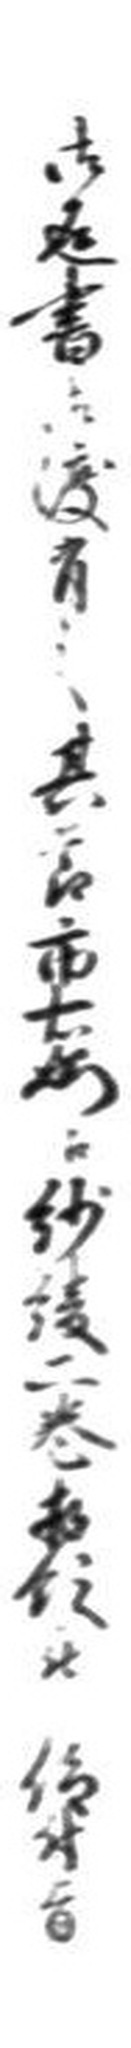御返書御渡有之其節市右衛門江紗綾二巻拝領被仰付旨
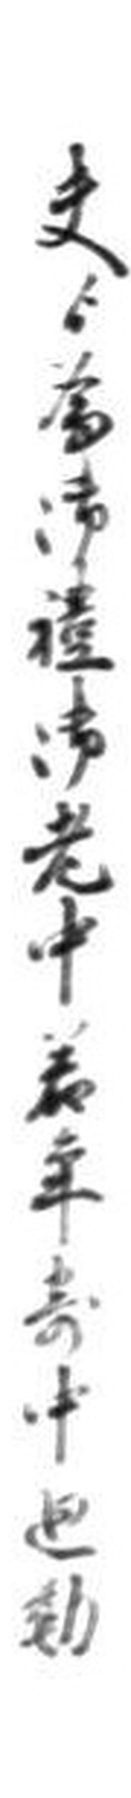夫ゟ為御礼御老中若年寄中廻勤
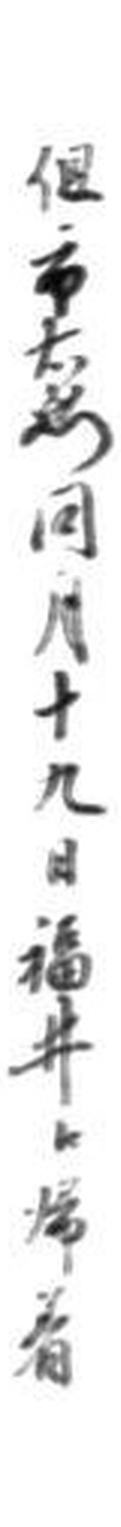但市右衛門同月十九日福井江帰着
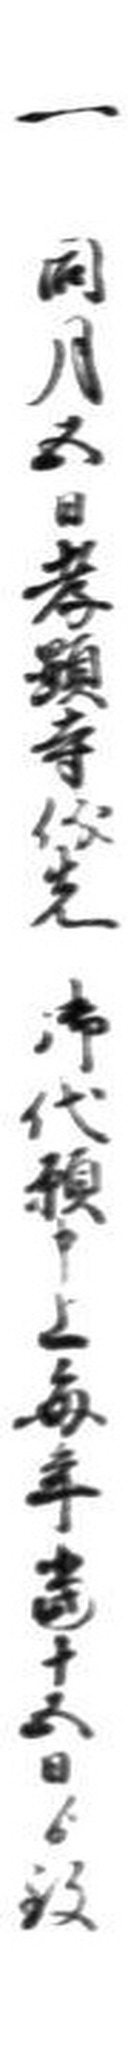一同月五日孝顕寺儀先御代願申上毎年当十五日ゟ致
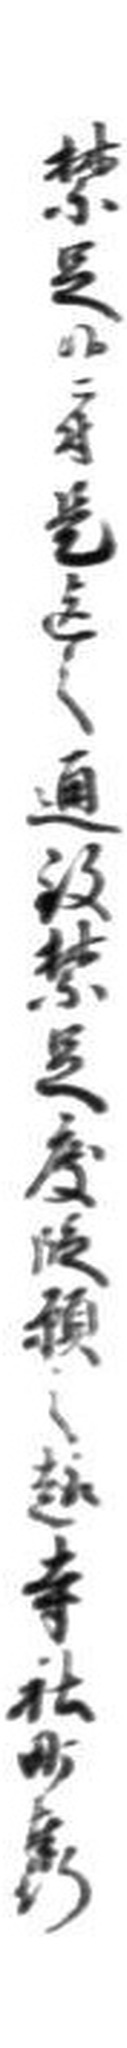禁足候ニ付是迄之通致禁足度段願之趣寺社町奉行

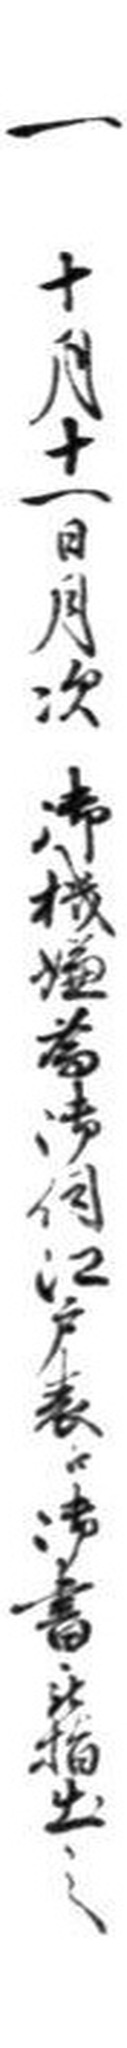一十月十一日月次御機嫌為御伺江戸表江御書被指出之
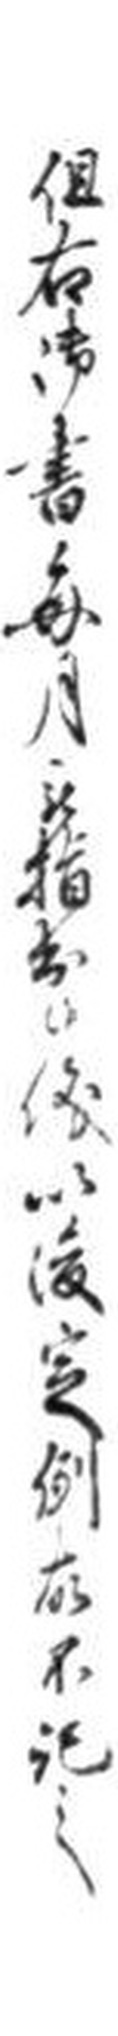但右御書毎月被指出候儀以後常例故不記之
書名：家譜 三十五 宗昌公 従享保六年到同七年
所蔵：福井県文書館 Fukui Prefectural Archives
